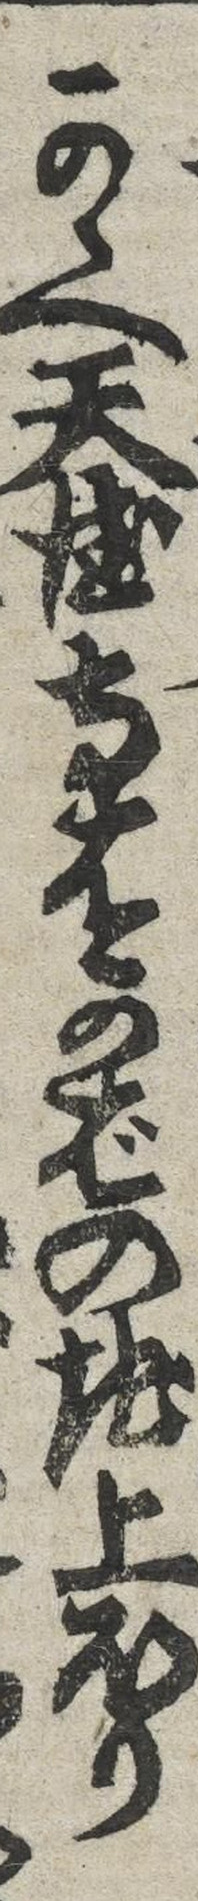かゝへ天徳寺はかばの地上ほり
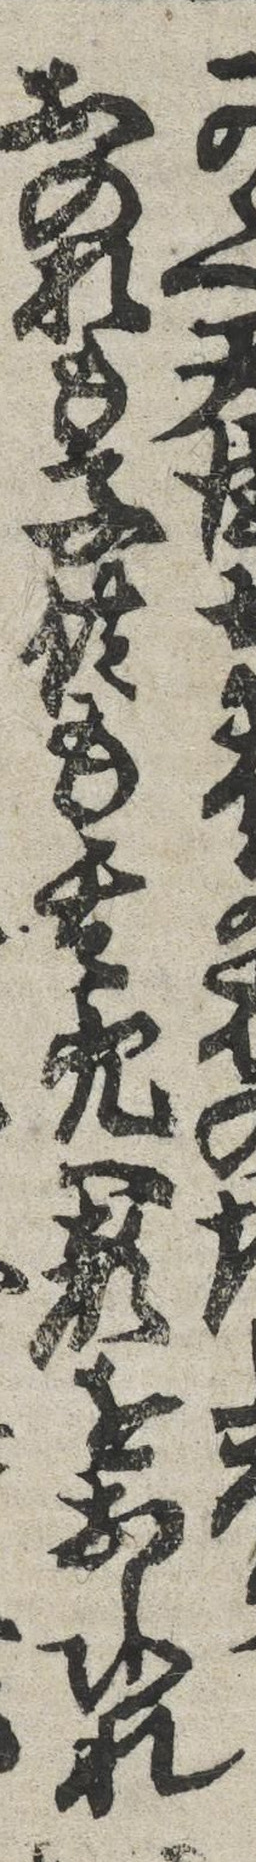おのれも子供も其穴へ顔をおしいれ
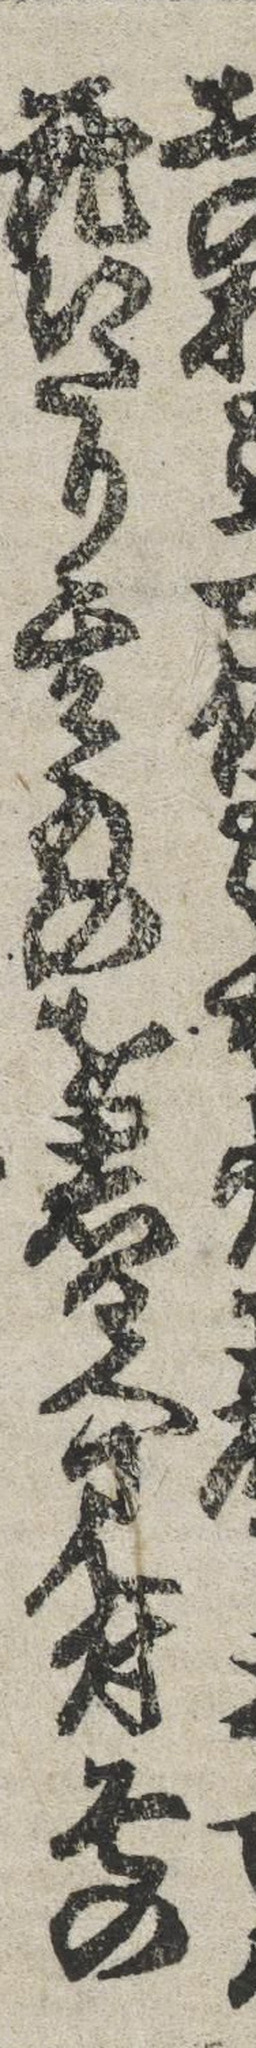死いたり其ものをしる人見付その
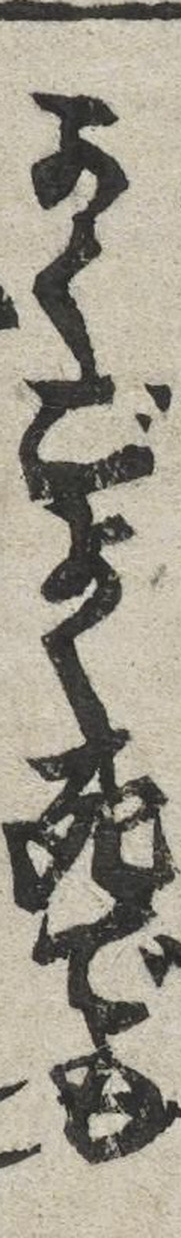かくごよく死でも
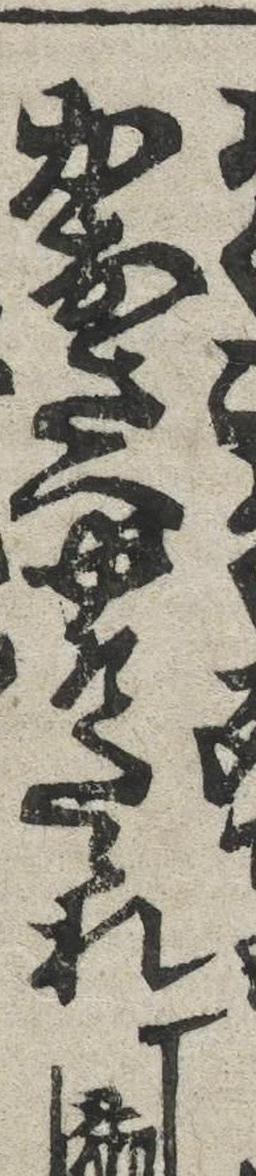かおさへやけたゝれ
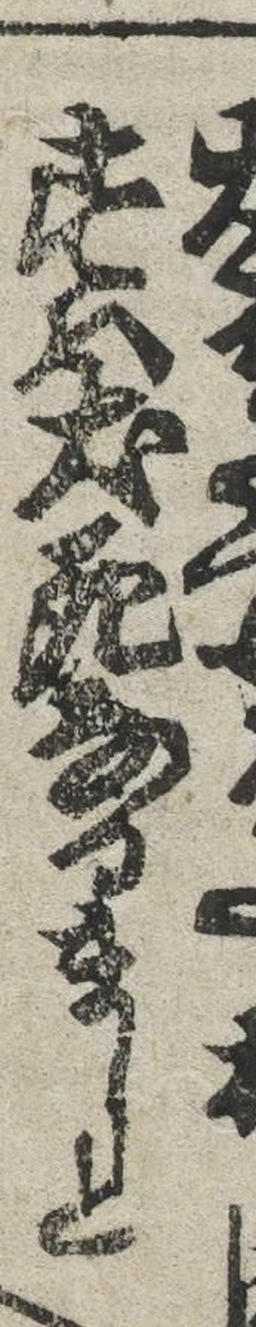すは犬死なるましと
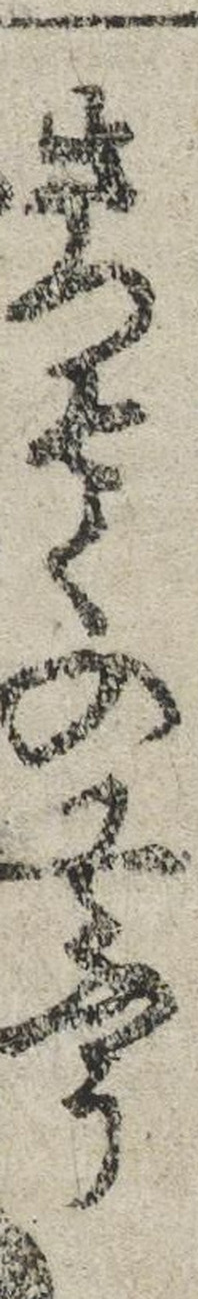さつそくの工ふう
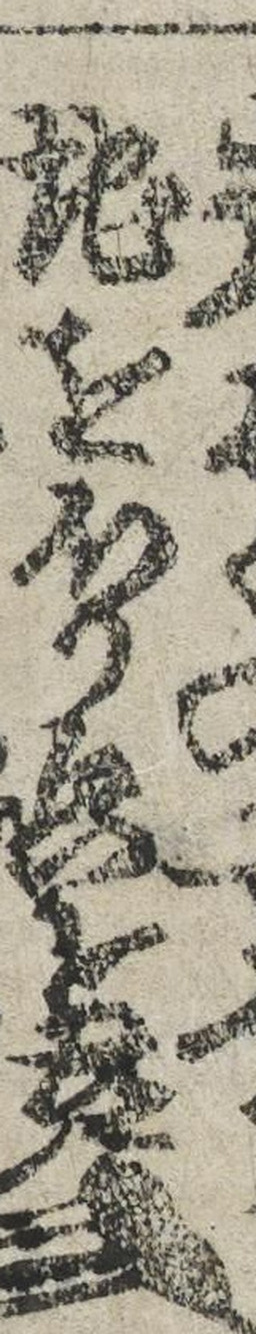地をほり㒵を土に
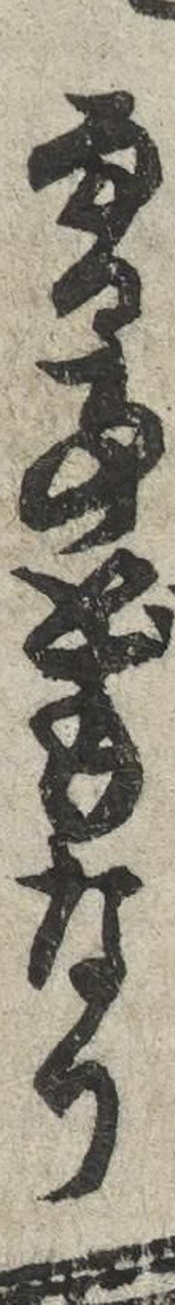なる事どもなり

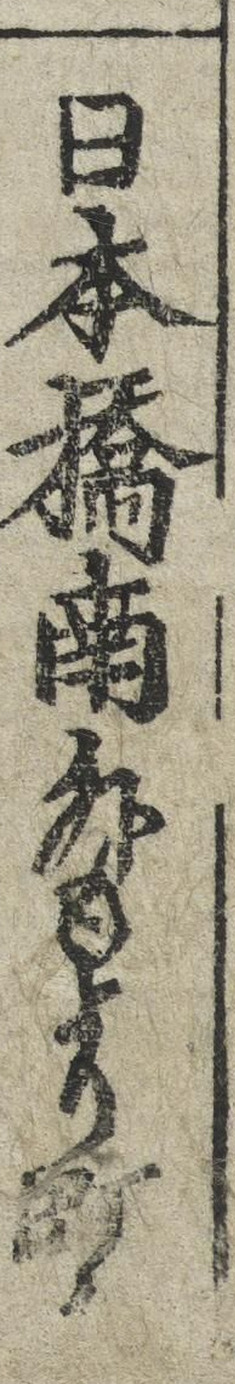同日本橋南外もより町〻
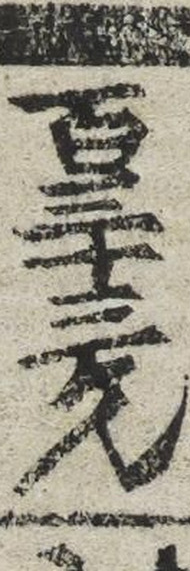百三十三けん
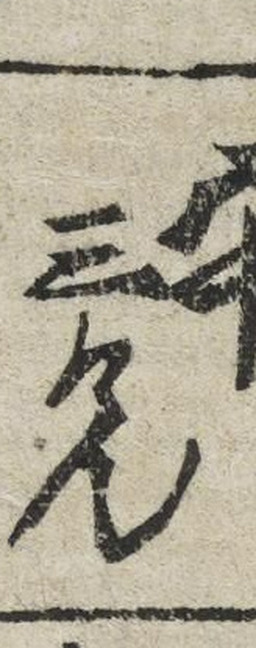七けん
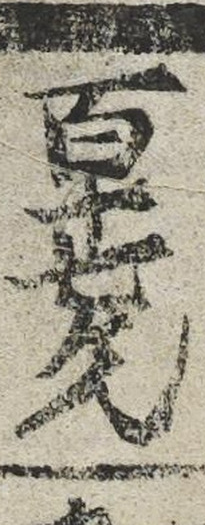百十六けん
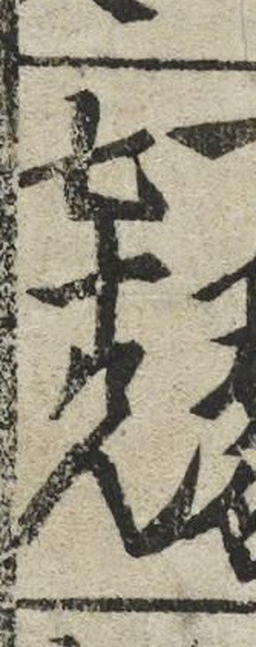七十けん
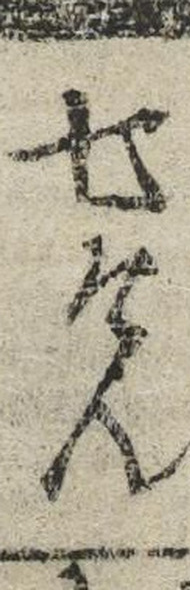七けん
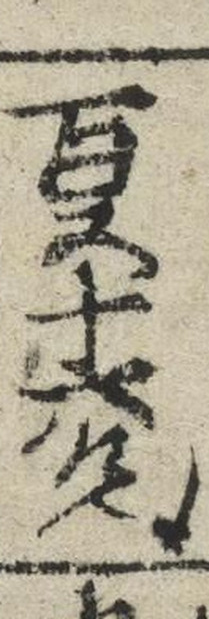百五十六けん
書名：[明暦大火に関する冊子]
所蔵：東京大学地震研究所図書室 Earthquake Research Institute Library, The University of Tokyo, JAPAN
